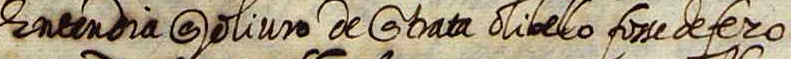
Entendia q̄ o liuro de q̄ trata o libello fosse defezo
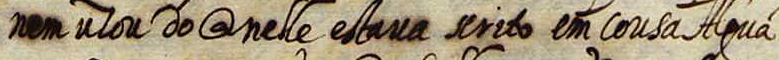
nem uzou do q̄ nelle estaua scrito em cousa Alguā
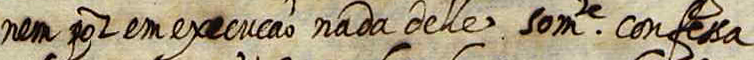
nem poz em execução nada delle somte. confessa
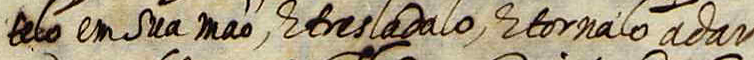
telo em sua maõ, E tresladalo, E tornalo a dar
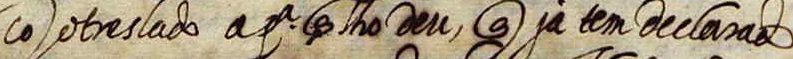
cō o treslado a p.a q̄ lho deu, q̄ ja tem declarado
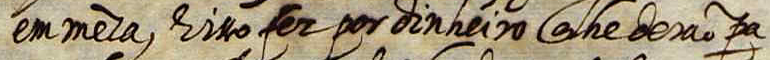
em meza, E isso fez por dinheiro q̄ lhe deraõ ꝑa
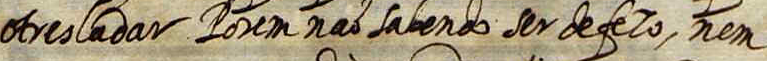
o tresladar Porem naõ sabendo ser defezo, nem
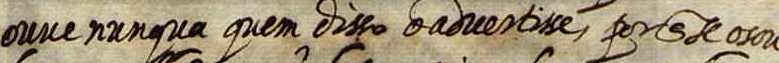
ouue nunqua quem disso o aduertisse, porq̄ se o sou
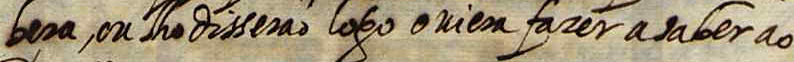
bera, ou lho disseraõ logo o uiera fazer a saber ao
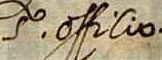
sto. officio.
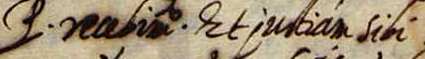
P. recebimto. Et justiām sibi
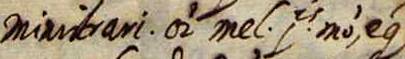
ministrari. oī mel. jis. mō, e q̄
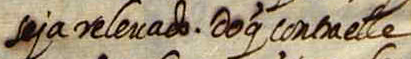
seja releuado. do q̄ contra elle
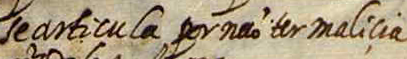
se articula por naõ ter malicia
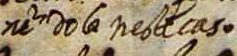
nē dolo neste caso
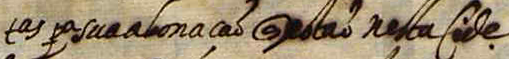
tas ꝑa sua abonaçaõ q̄ estaõ nesta Cide.
